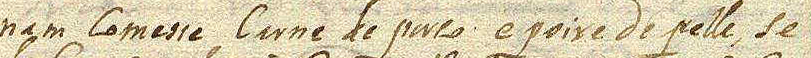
nam Comesse Carne de porco e peixe de pelle, se
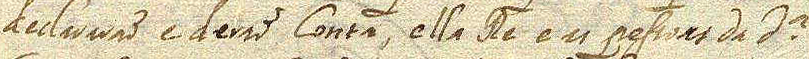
declararaõ e deraõ Conta, ella Re e as pessoas da d.a
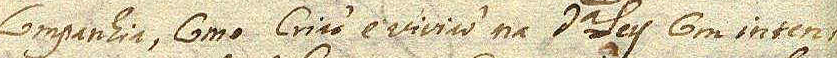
Companhia, Como Criaõ e viviaõ na da Ley com inten
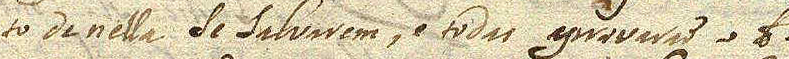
to de nella Se Salvarem, e todas aprovaraõ o d.o
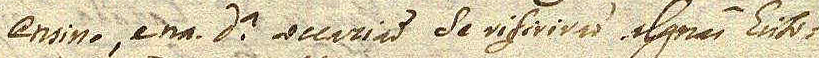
ensino, e na d.a occaziaõ Se rifiriraõ alguâs histo
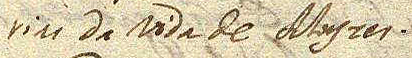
rias da vida de Moyzes.
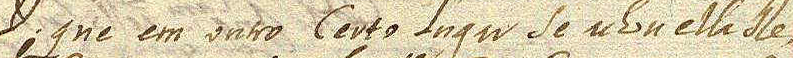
P. que em outro Certo Lugar se achou ella Re,
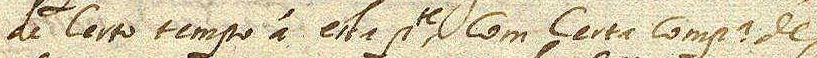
de Certo tempo á esta pte, Com Certa Compa. de
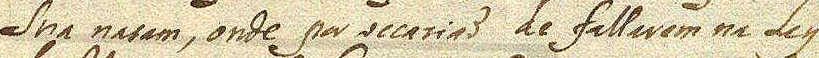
Sua nasam, onde por occaziaõ de fallarem na Ley
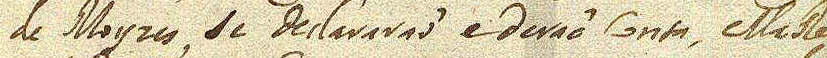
de Moyzes, se declararaõ e deraõ Conta, ella Re
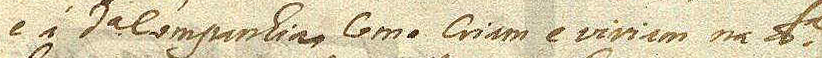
e á da. Companhia Como Criam e viviam na d.a
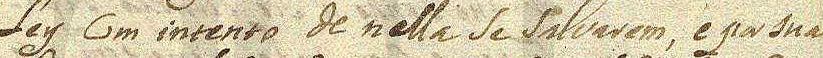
Ley Com intento de nella Se Salvarem, e por sua
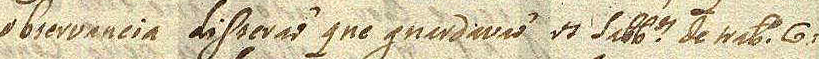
observancia disseraõ que guardavaõ os Sabb.os de trab̄.o co
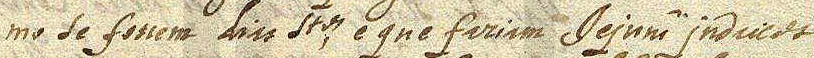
mo se fossem dias Stos, e que faziam Iejuns̄ judaicos
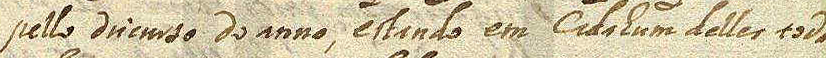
pello discurso do anno, estando em Cada hum delles todo
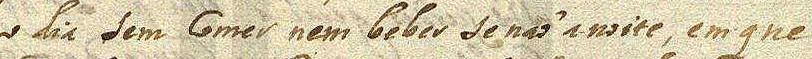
o dia Sem Comer nem beber senaõ a noite, em que
